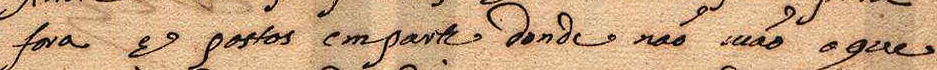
fora E postos em parte donde naõ uiaõ o que
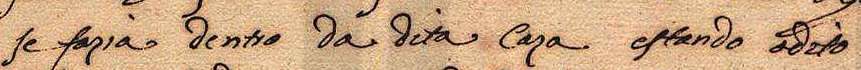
se fazia dentro da dita caza estando o dito
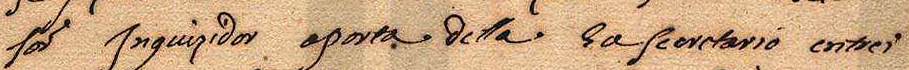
sōr Jnquizidor a porta della Eu secretario entrei
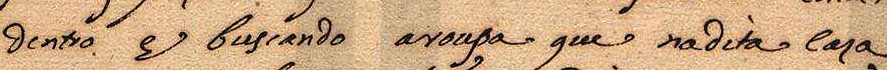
dentro E buscando a roupa que na dita caza
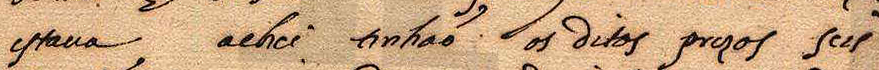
estaua achei tinhaõ os ditos prezos seis
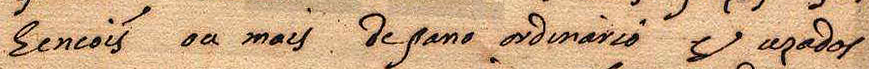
lençois̄ ou mais de pano ordinario E uzados
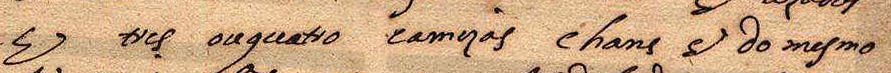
E tres ou quatro camizas chans E do mesmo
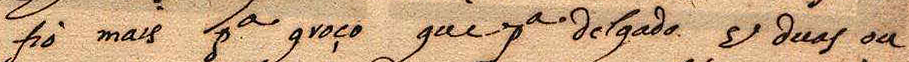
fio mais pa groço que pa delgado E duas ou
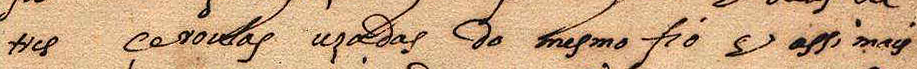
tres ceroulas uzadas do mesmo fio E assi mais
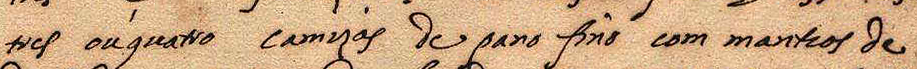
tres ou quatro camizas de pano fino com manteos de
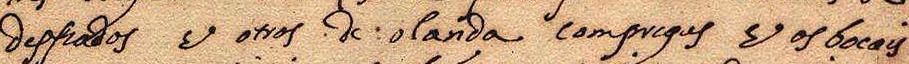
desfiados E otros de olanda com pregas E os bocais
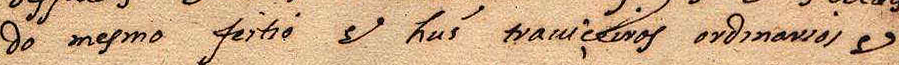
do mesmo feitio E hus̄ trauiceiros ordinarios E
